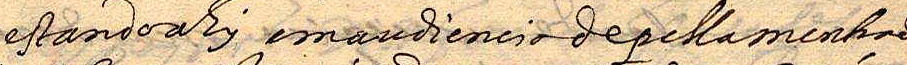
estando ahy em audiencia de pella menhaā
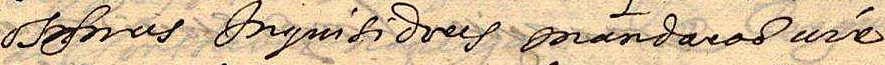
os Snres Inquisidores mandaraõ uir
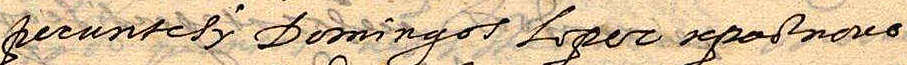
perante sy Domingos Lopez xpaõ nouo
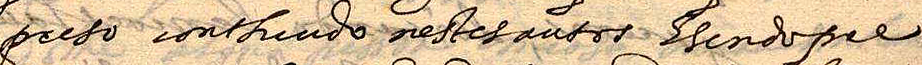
preso contheudo nestes autos E sendo pre
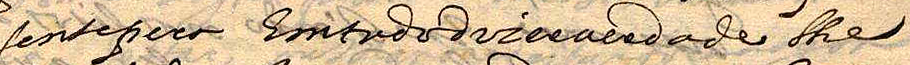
sente pera Em tudo dizer uerdade lhe
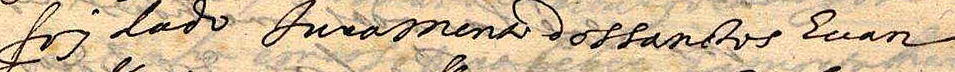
foj dado Juramento dos sanctos Euan
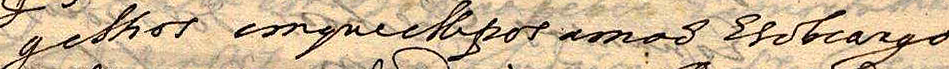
gelhos em que elle pos a maõ E sob cargo
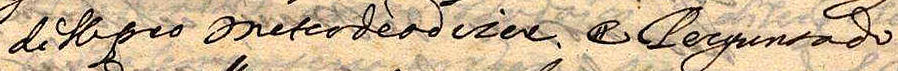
delle prometeo de a dizer. ¶ Perguntado
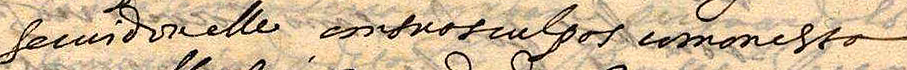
se cuidou elle em suas culpas como nesta
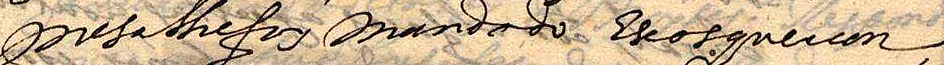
mesa lhe foy mandado E se as quer con
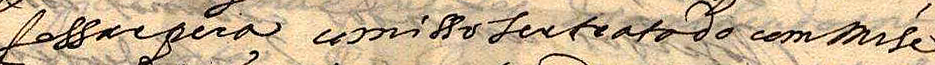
fessar pera com isso ser tratado com mise
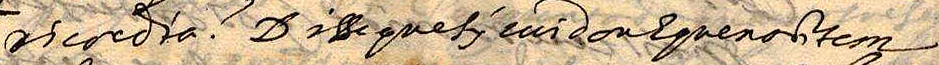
ricordia? Disse que sy cuidou E que naõ tem
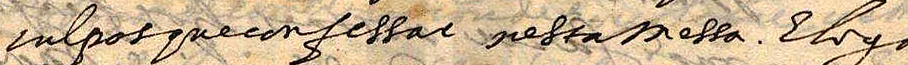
culpas que confessar nesta messa. E logo
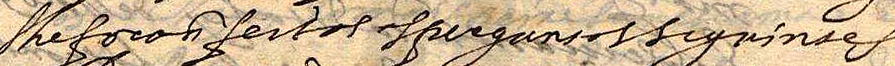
lhe foraõ feitas as perguntas seguintes
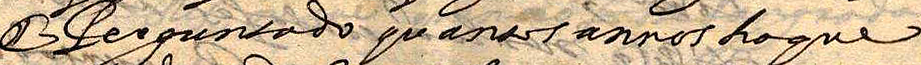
¶ Perguntado quantos annos ha que
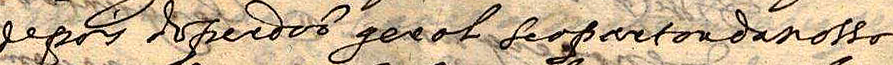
depois do perdaõ geral se apartou da nossa
